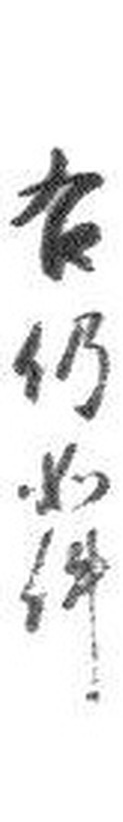右仍如件
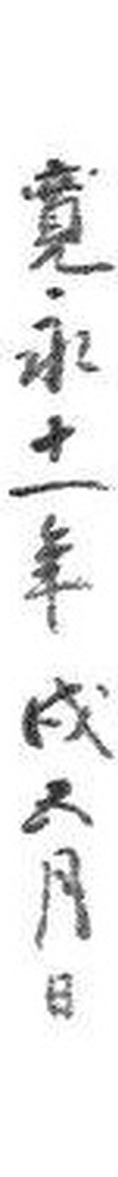寛永十一年戌五月日
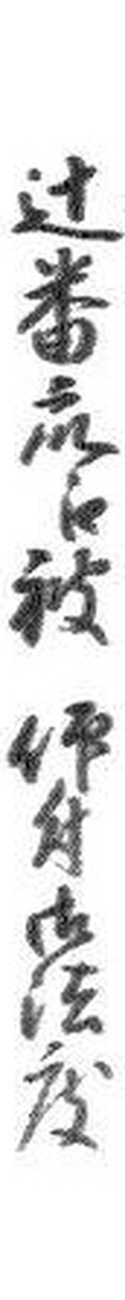辻番衆江被仰付御法度
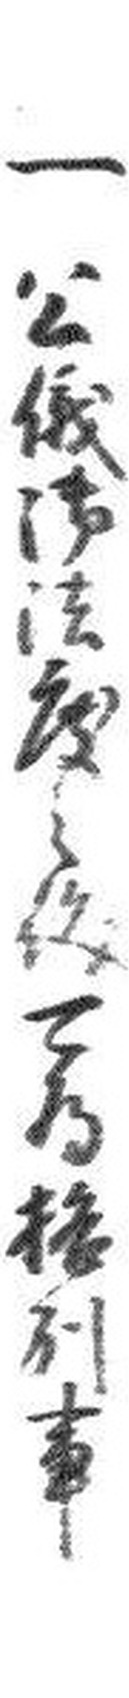一公儀御法度之儀可為格別事
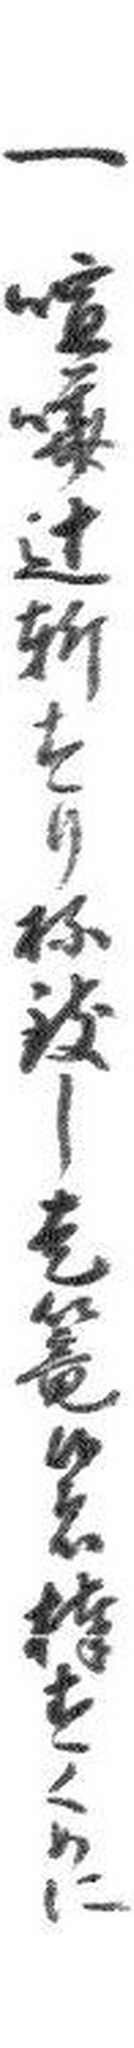一喧嘩辻斬すり抔致し走篭候者棒すくめに
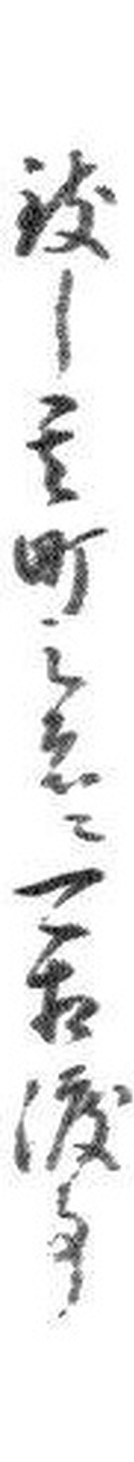致し其町之者ニ可相渡事
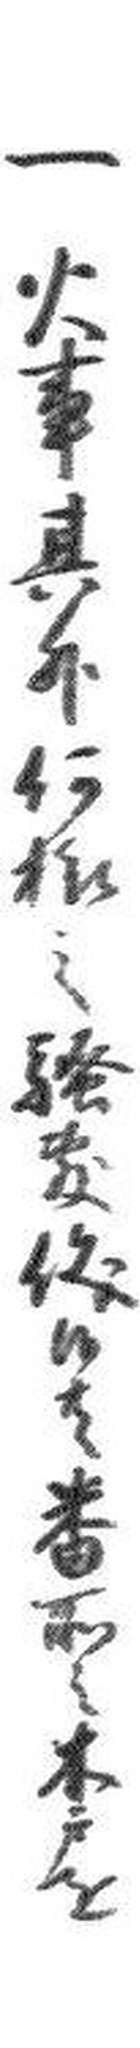一火事其外何様之騒敷儀候共番所之木戸を
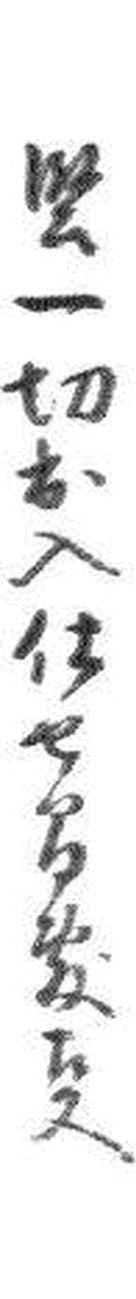堅一切出入仕セ間敷事

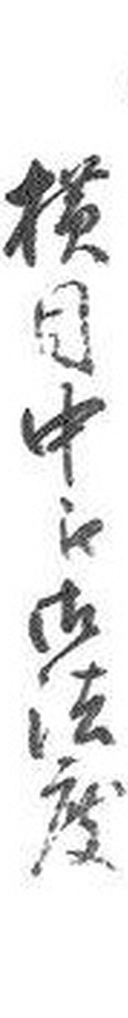横目中江御法度
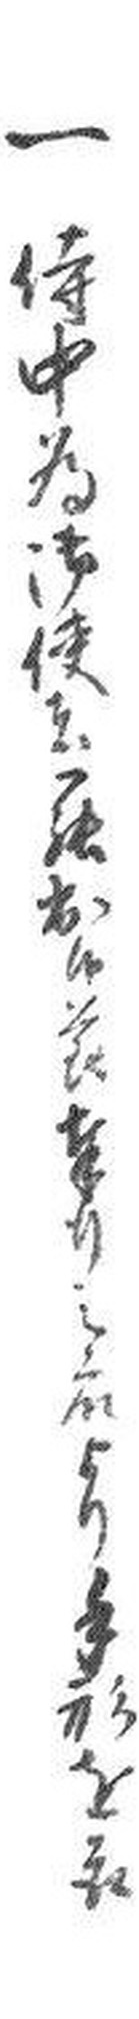一侍中為御使者罷出候節奉行之衆より手形を取
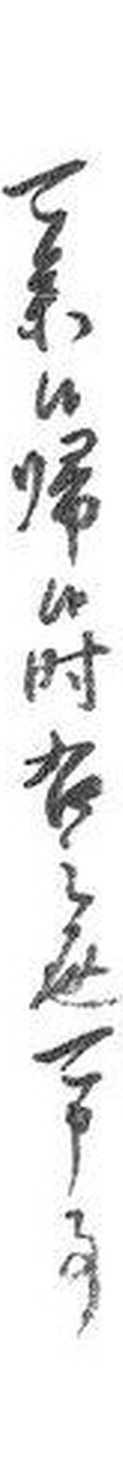可参候帰候時右之通可申事
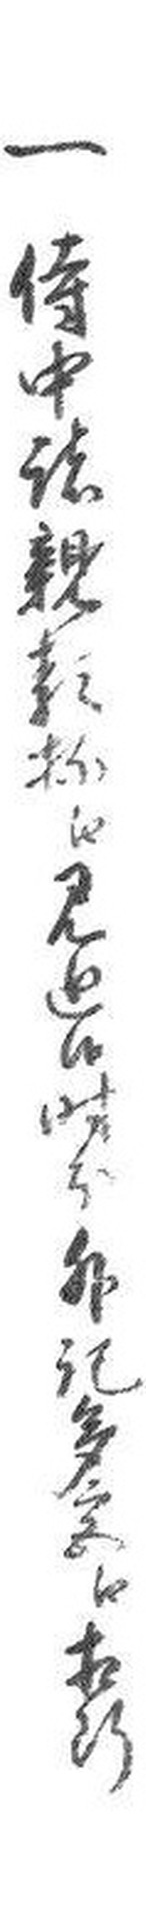一侍中諸親類抔江見廻候時分外記多宮江相断
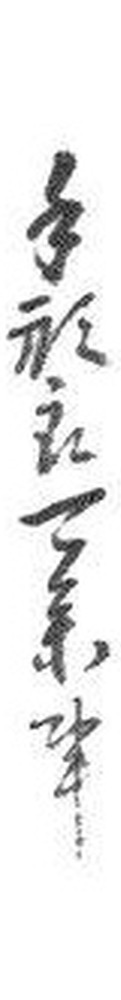手形取可参事
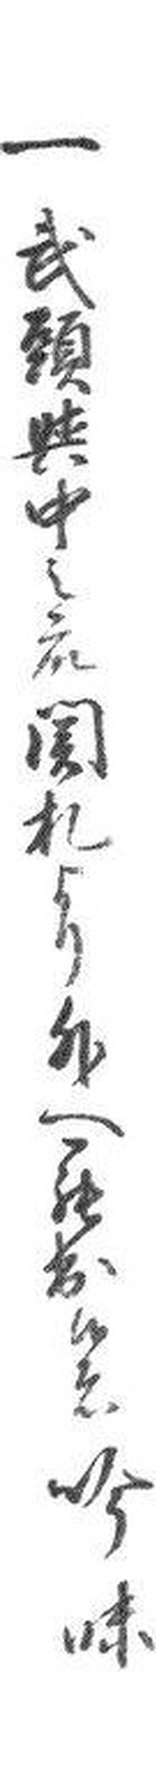一武頭與中之衆関札より外へ罷出候者吟味
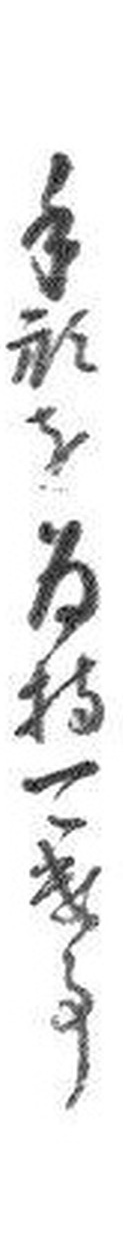手形を為持可遣事
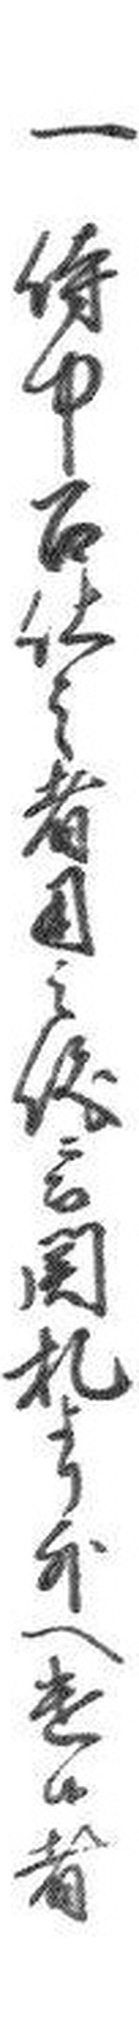一侍中召仕之者用之儀ニ而関札より外へ遣候者
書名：家譜 四 忠昌公 従寛永七年到正保四年
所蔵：福井県文書館 Fukui Prefectural Archives
